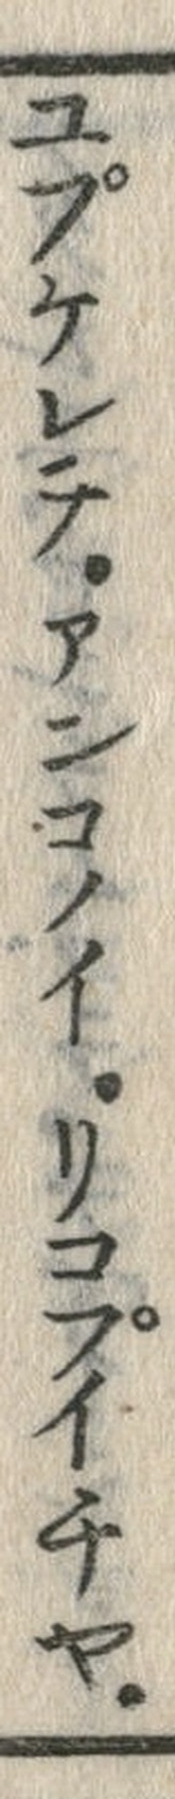ユプケレチ。アンコノイ。リコプイチヤ。
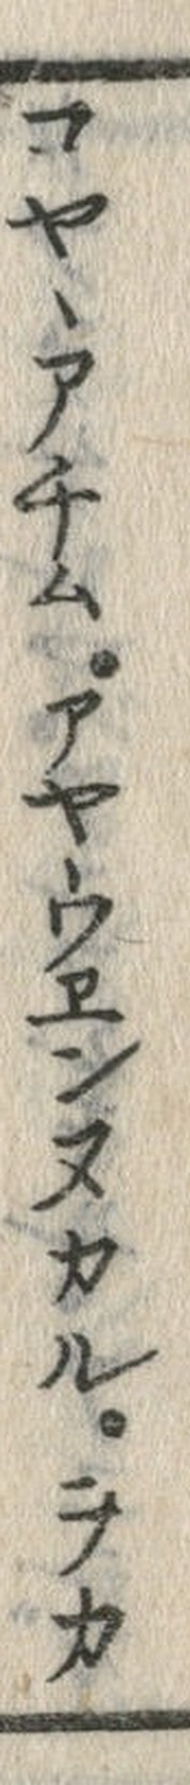コヤヽアチム。アヤウヱンヌカル。ヲカ
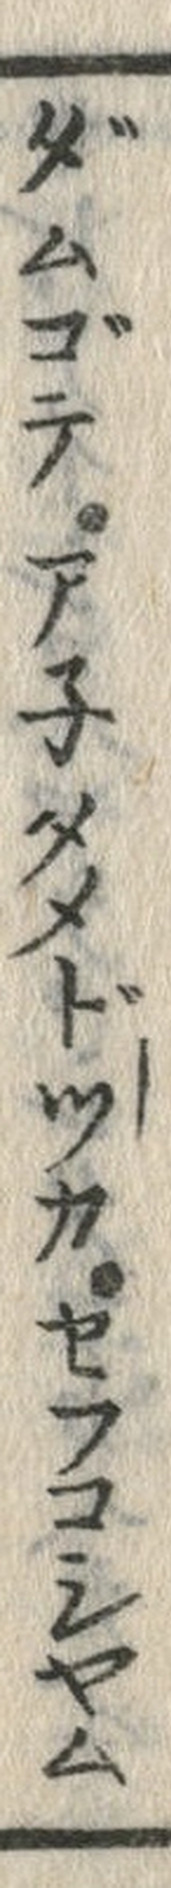ダムゴテ。アネタメドツカ。セフコシヤム
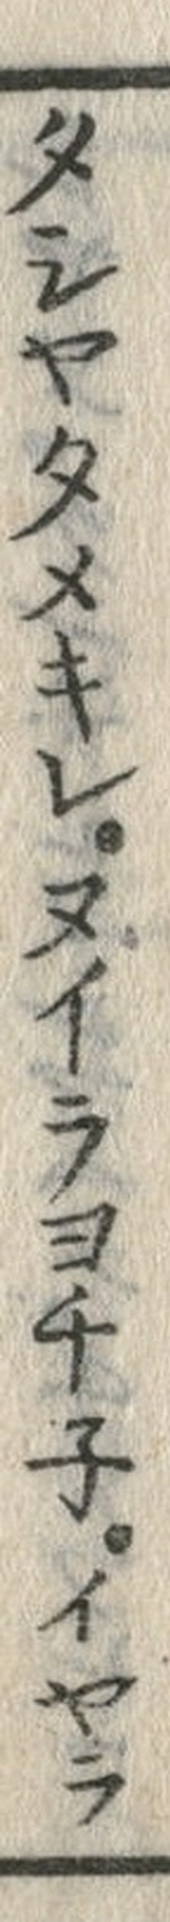タシヤタメキレ。ヌイラヨチネ。イヤラ
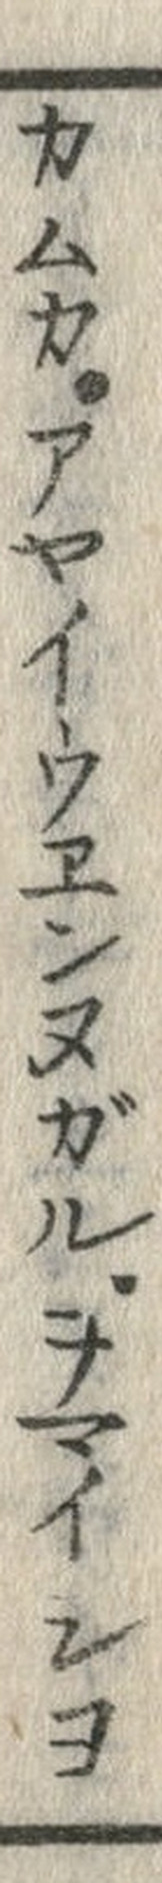カムカ。アヤイウヱンヌガル。ヲマイシヨ

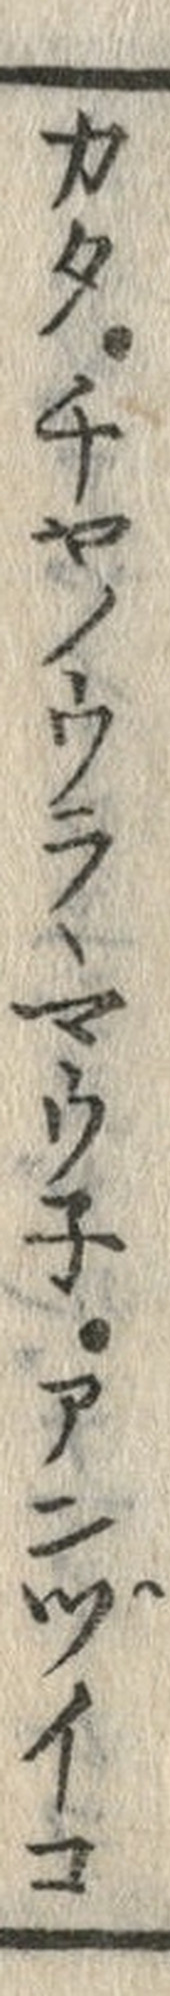カタ。チヤノウラヽマウネ。アンツ゚イコ
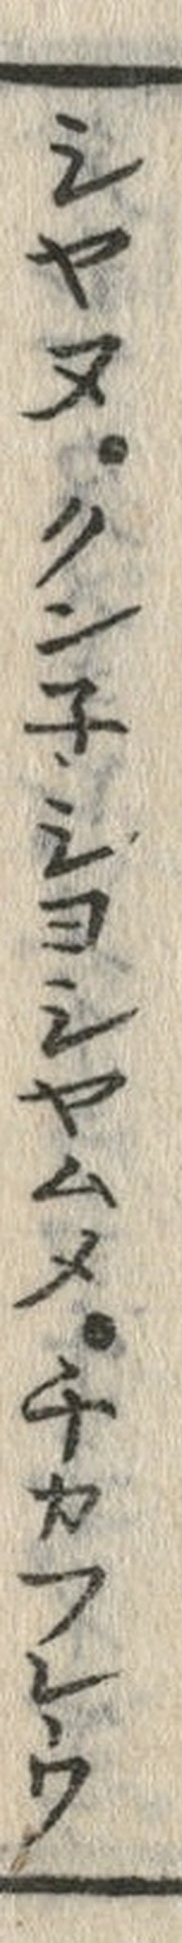シヤヌ。クンネシヨシヤムメ。チカフレウ
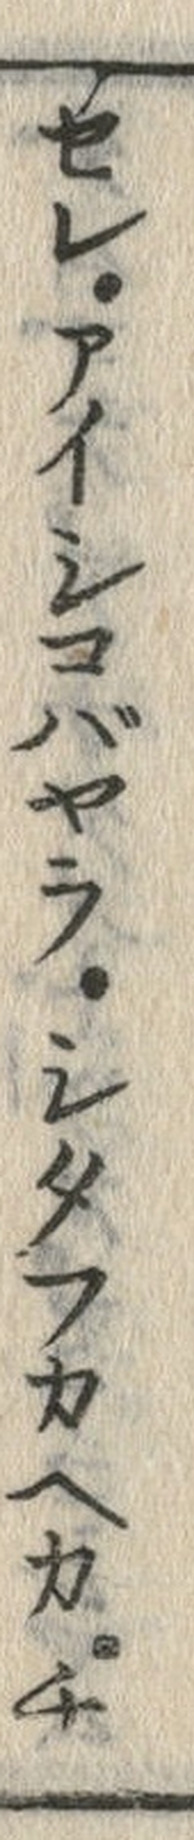セレ。アイシコバヤラ。シタフカヘカ。チ
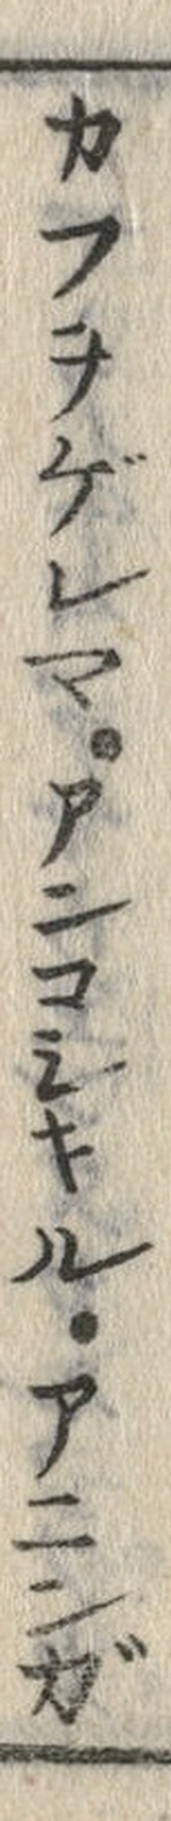カフヲゲレマ。アンコシキル。アニンガ
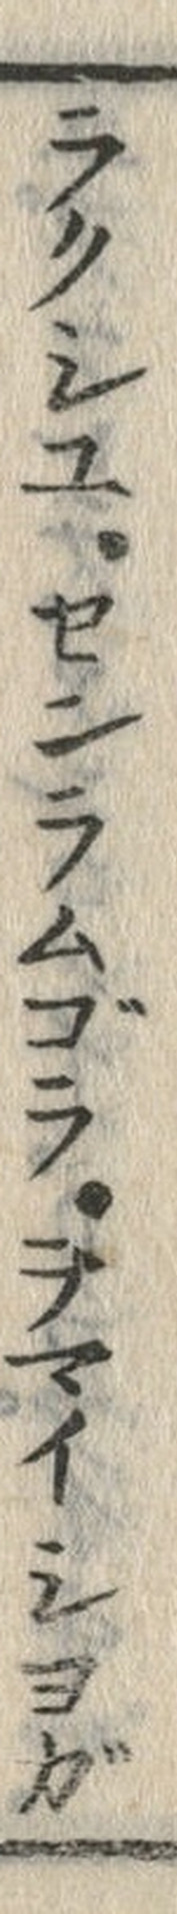ラクシユ。センラムゴラ。ヲマイシヨ
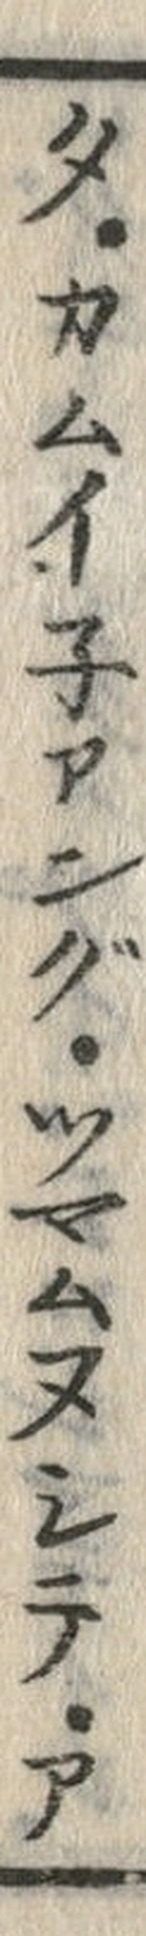ガタ。カムイネアング。ツマムヌシテ。ア
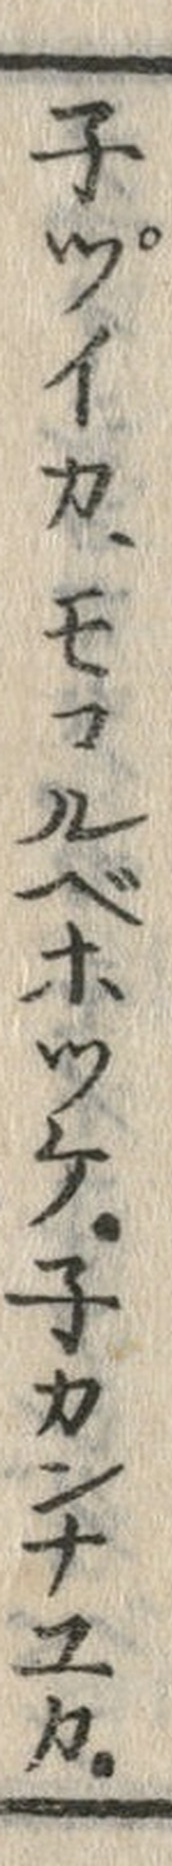ネツ゚イカ。モコルベホツケ。ネカンナユカ。
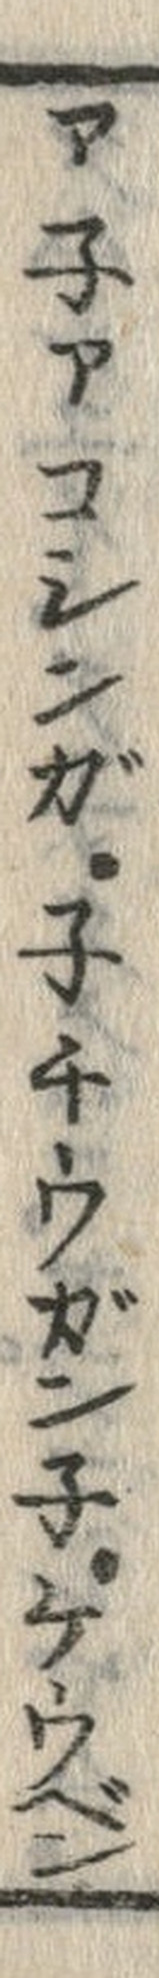アネアコシンガ。ネチウガンネ。ケウベン

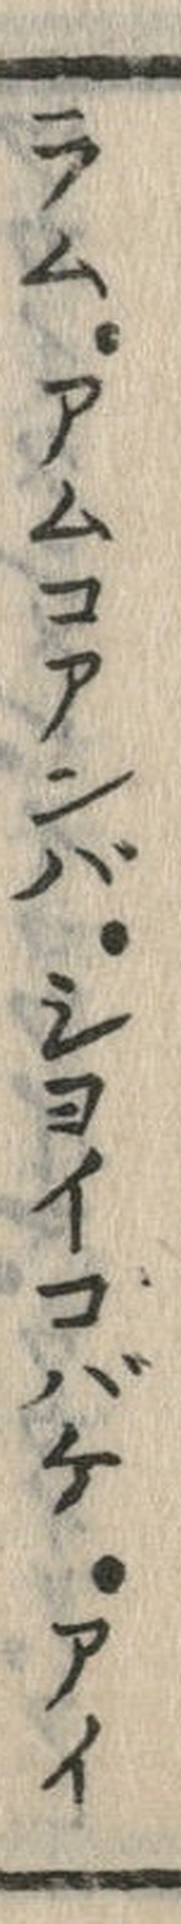ラム。アムコアンバ。シヨイゴバケ。アイ
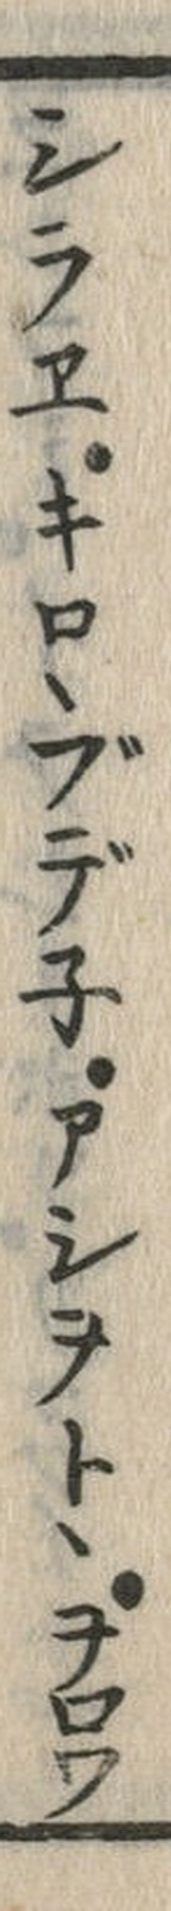シラヱ。キロヽブデネ。アシヲトヽ。ヲロワ
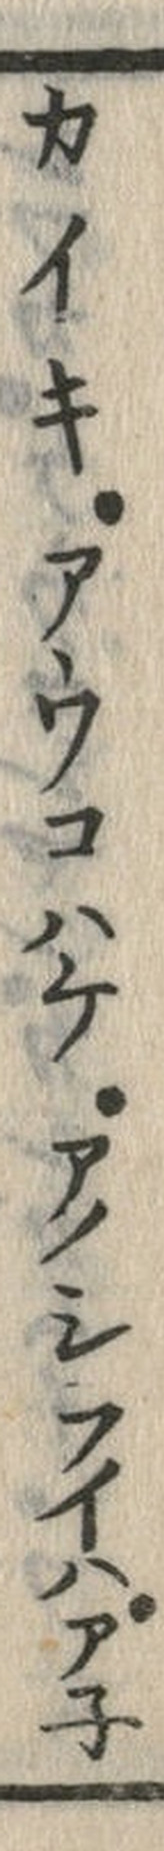カイキ。アウコハケ。アノシライハ。アネ
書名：蝦夷方言藻汐草　坤巻
